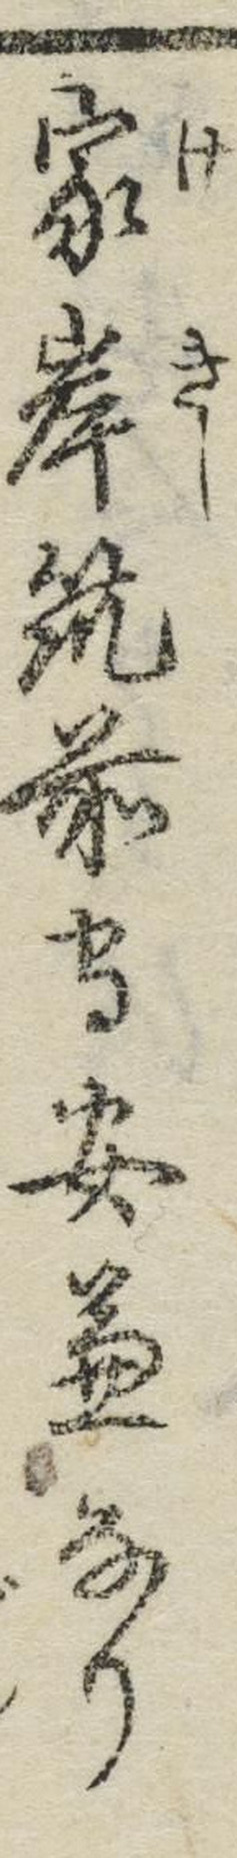家岸筑前守安兼なり
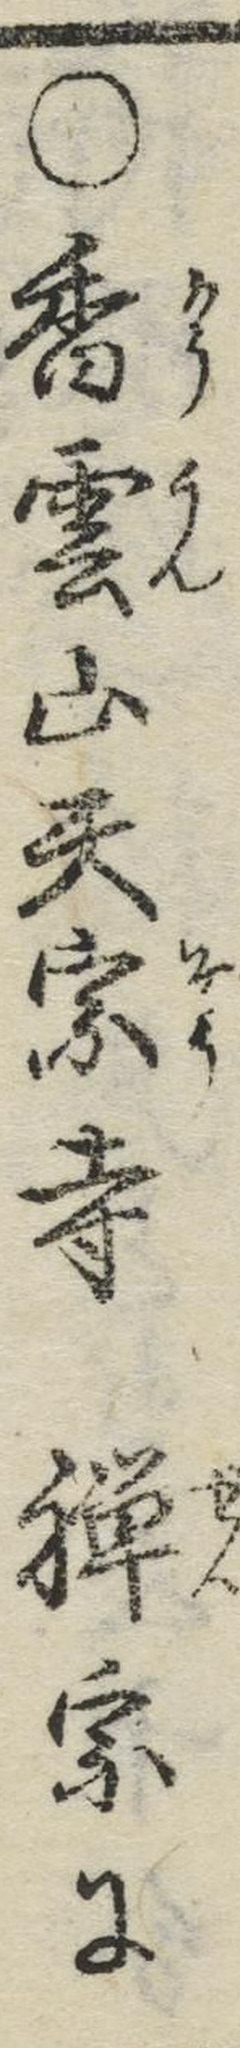○香雲山天宗寺禅宗に
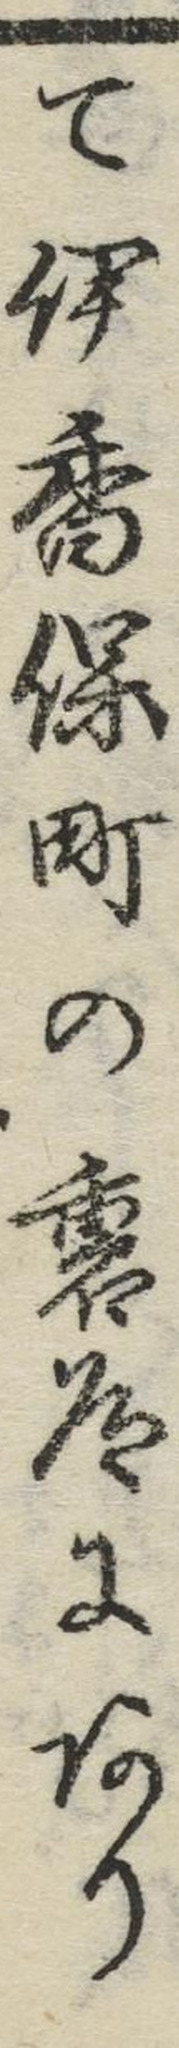て伊香保町の裏道にあり
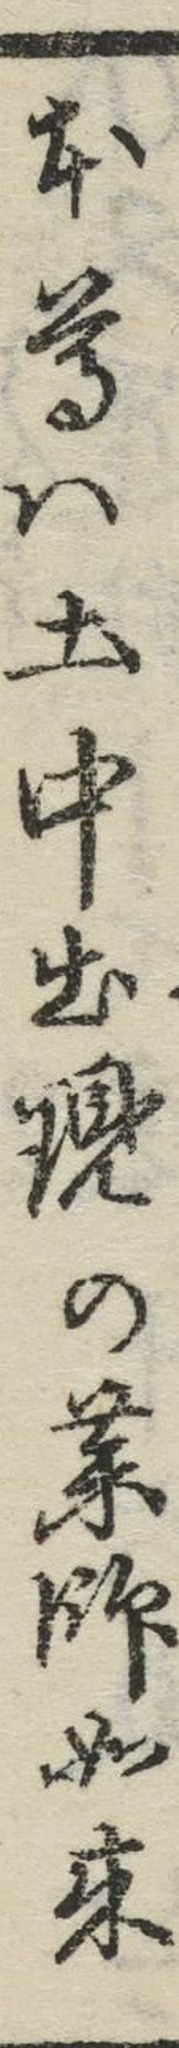本尊は土中出現の薬師如来
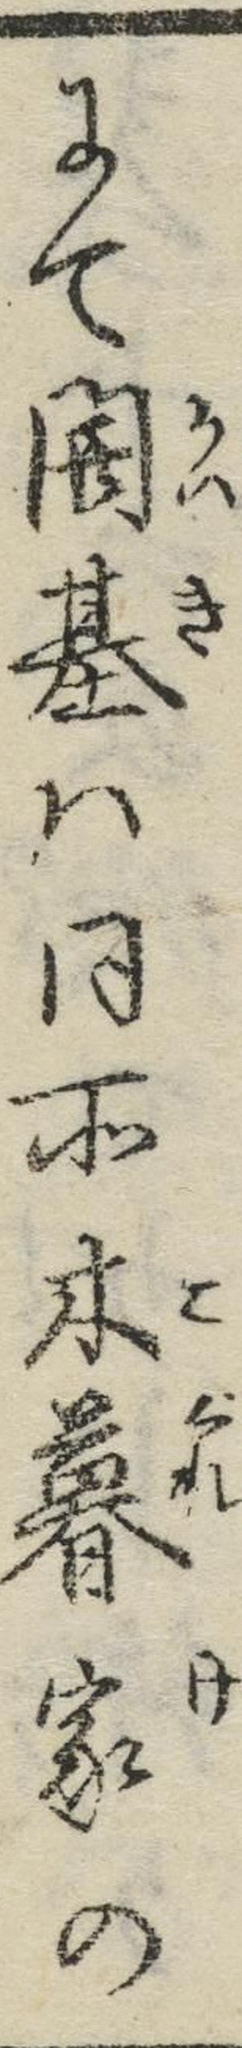にて開基は同所木暮家の
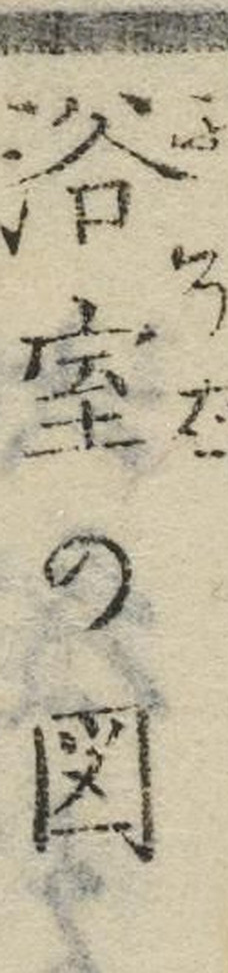浴室の図
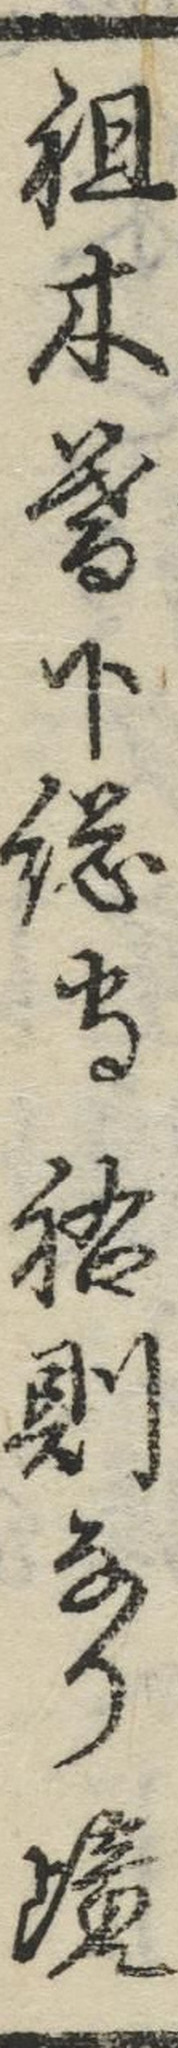祖木暮下総守祐利なり境
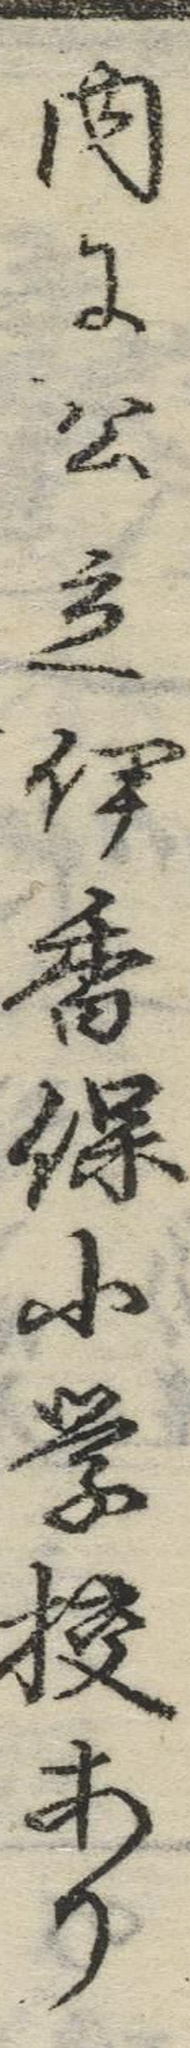内に公立伊香保小学校あり
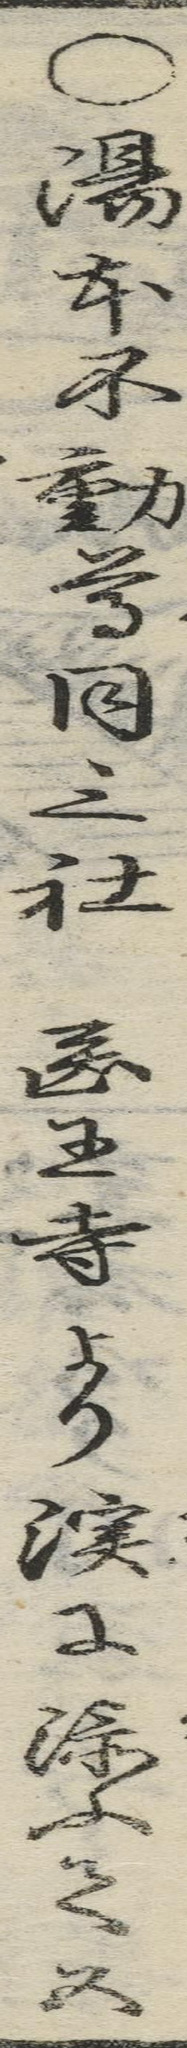○湯本不動尊同三社医王寺より溪に添ふて五
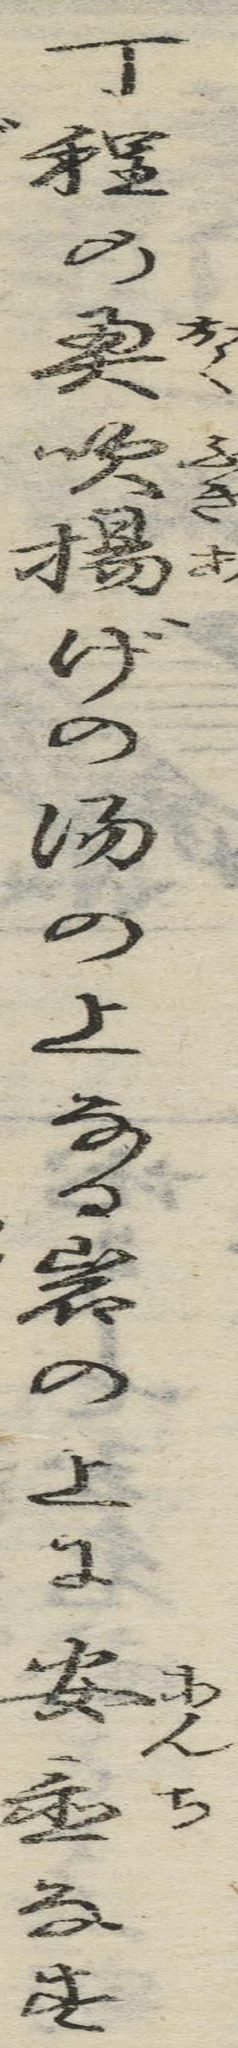丁程の奥吹揚げの湯の上なる岩の上に安置なす
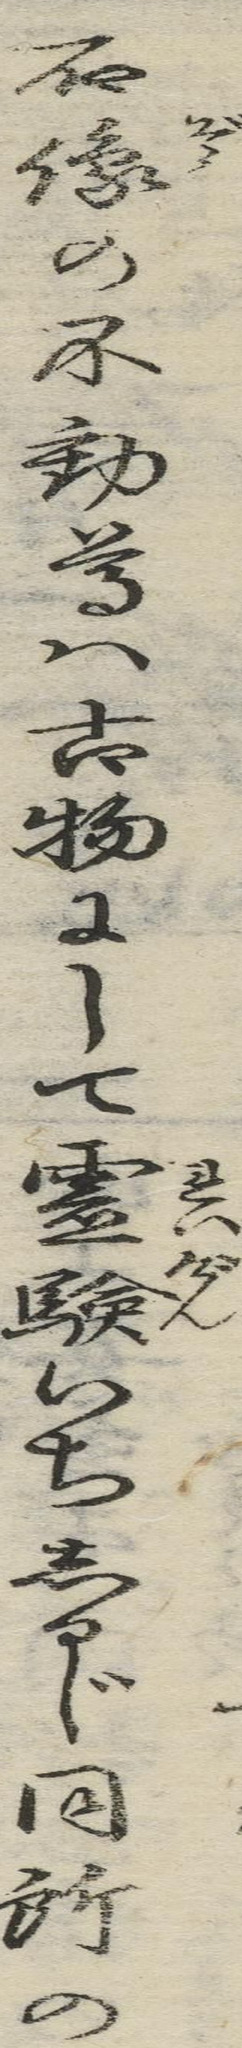石像の不動尊は古物にして霊験いちしるじ同所の
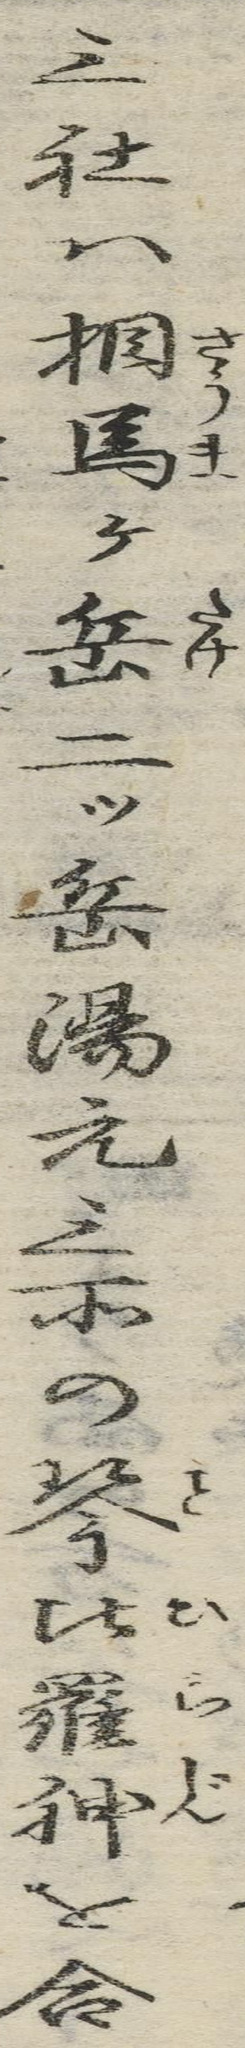三社は相馬ヶ岳二ツ岳湯元サンショの金比羅神を合
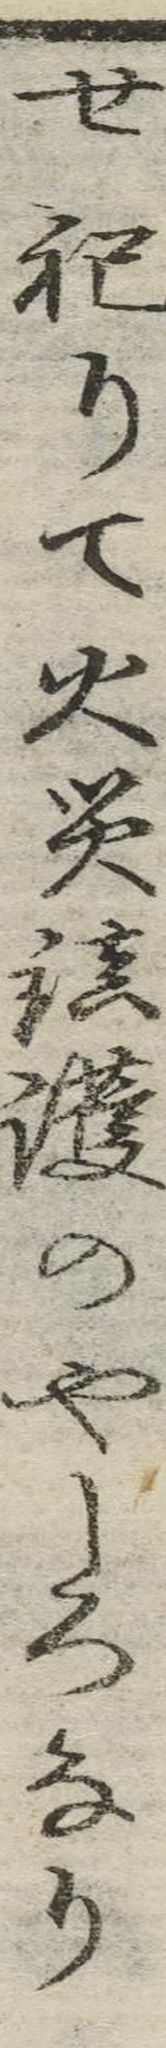せ祀りて火災鎮護のやしろなり
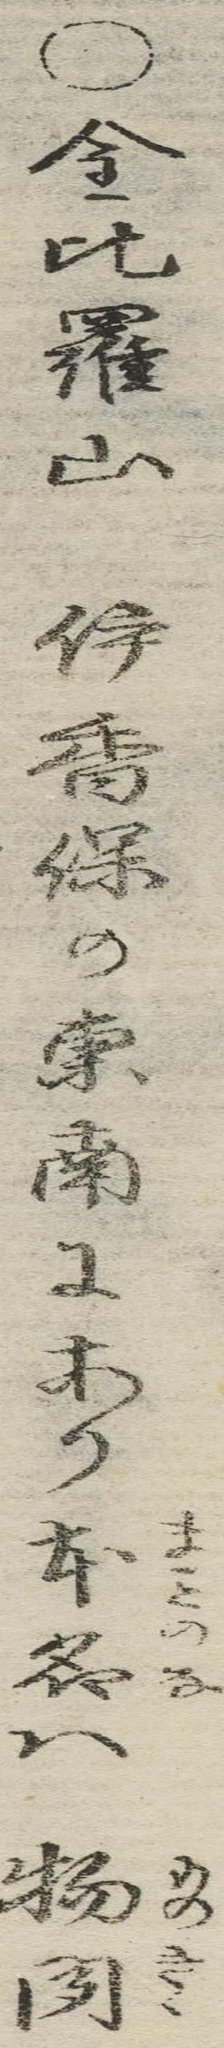○金比羅山伊香保の東南にあり本名は物聞
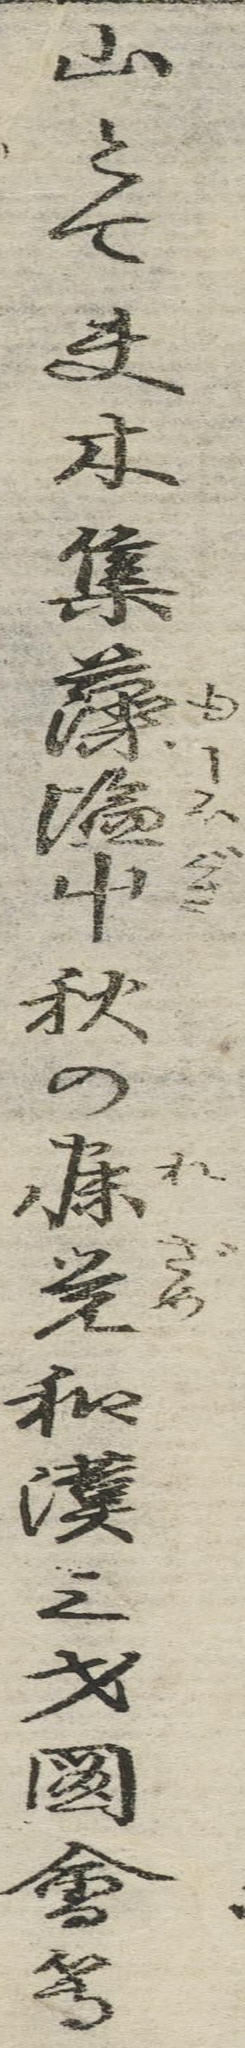山とて夫木集藻塩草秋の寝覚和漢三才図会等
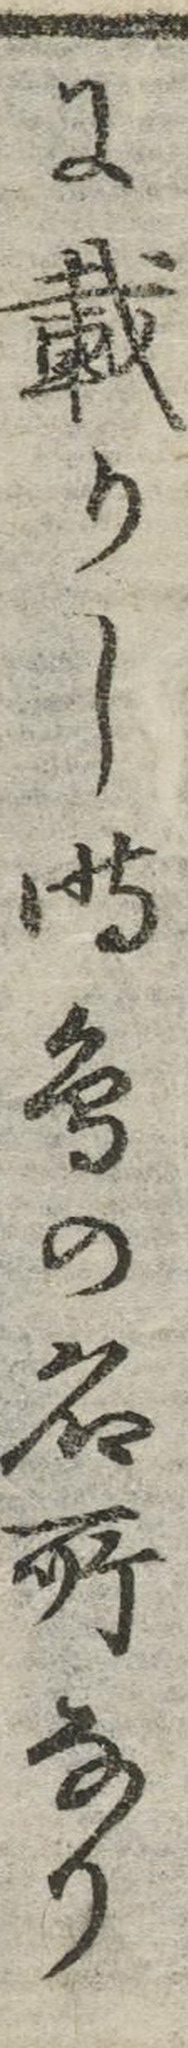に載りし時象の名所なり
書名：上州伊香保鑛泉圖會　全
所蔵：東京大学地震研究所図書室 Earthquake Research Institute Library, The University of Tokyo, JAPAN
